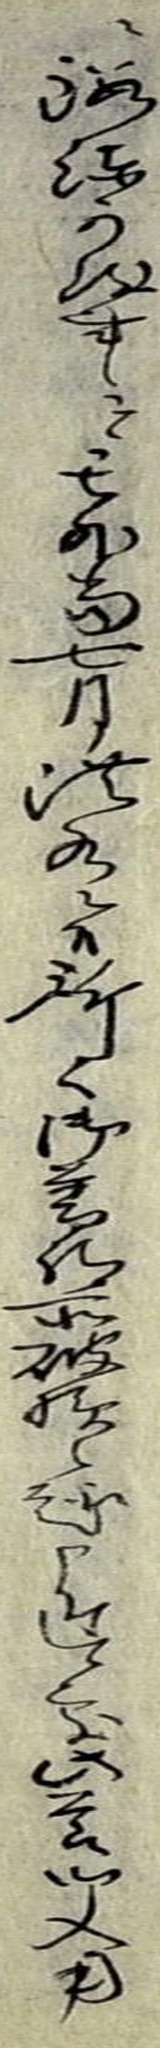ニ鍛錬可致事ニ候其外当七月洪水ニ付所々御普請所破損之趣申達候処此節御入用
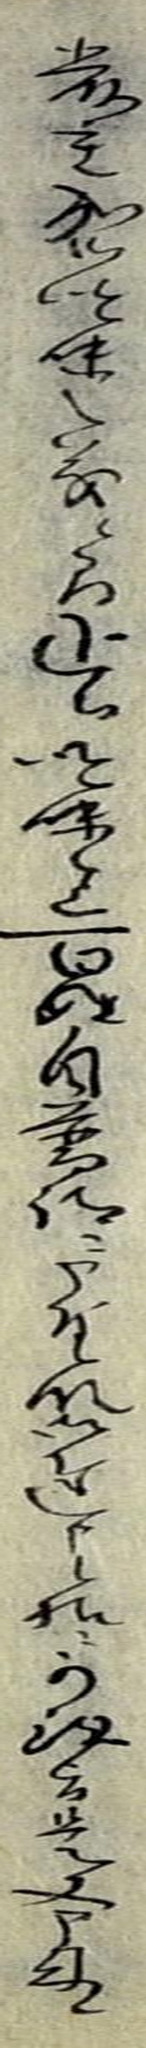厳重成御吟味之義候間追而吟味之上百姓自普請ニ申付候段御達申候様ニ可致旨是又申来候
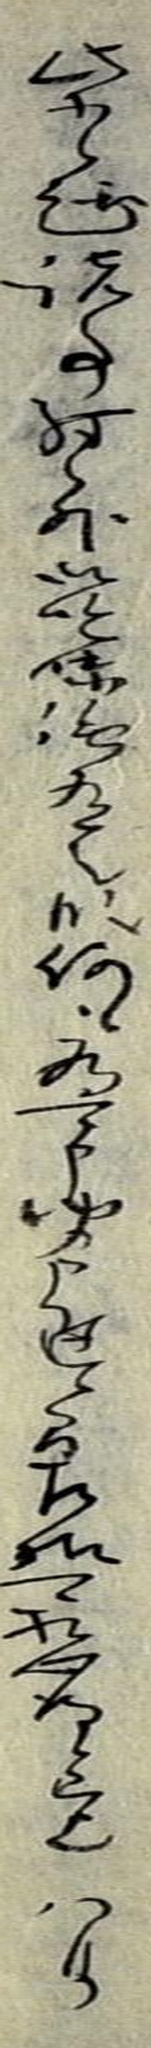此等之趣諸事殊之外御吟味強有之段何も為可申聞申達候間左様可相心得候已上八月
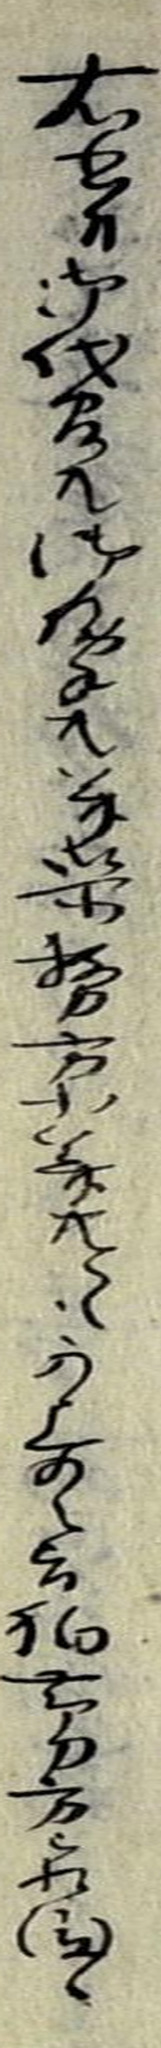右書付御代官共御勝手共并御所務方小算共へも可申聞候旨狛帯刀方被相渡候
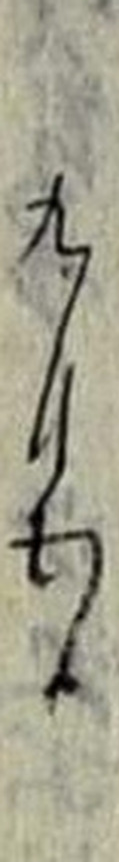九月五日
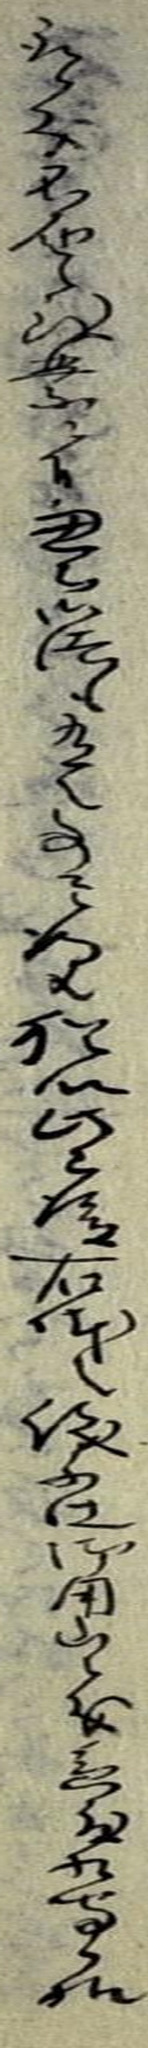取候義不届之致業ニ付兼而御法も有之事ニ候得共猶以此已後右体之儀不仕御用山之義急度相守候様
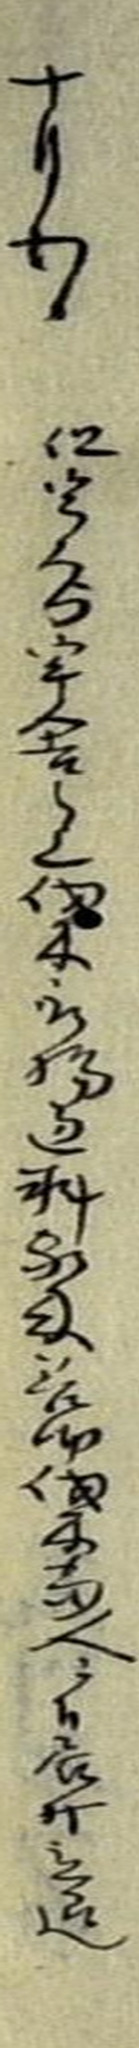十月五日但宇右衛門牢舎之上伐木取揚過料家来善助伐木当人ニ付居村立退
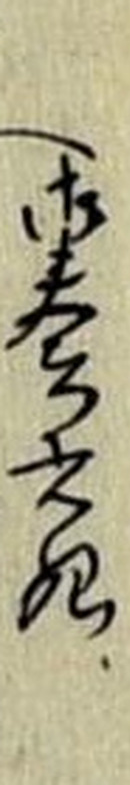御奏者始
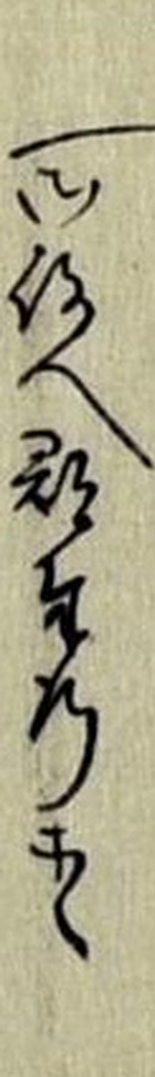御役人郡奉行等へ
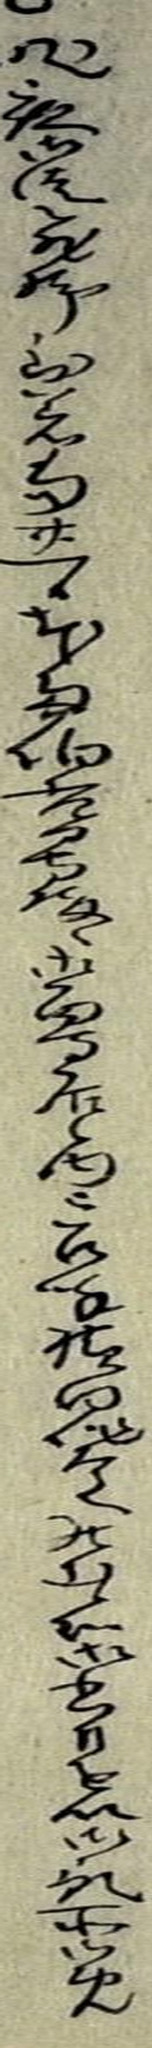〇昨夜御徒飛脚到着当廿一日本多伯耆守殿へ御留守居之内被召呼横田作太夫罷出候処御書付を以御預所御免
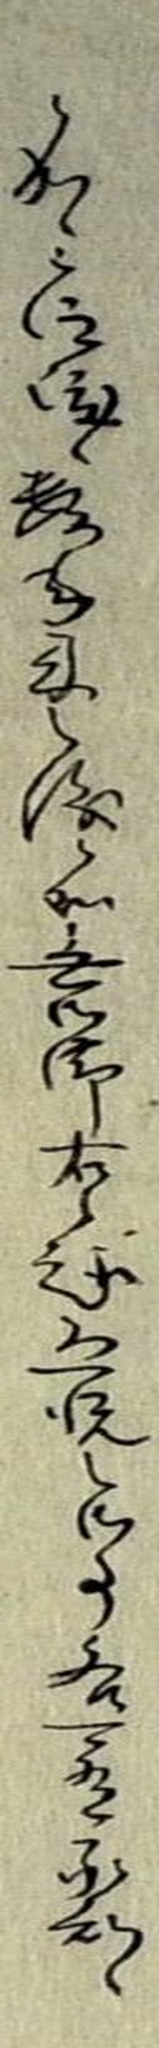被成候被仰渡候数年来之儀ニ無御滞右之趣恐悦之御事各可有承知候
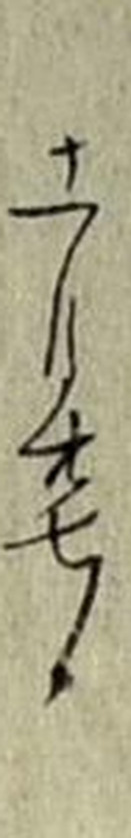十一月廿七日
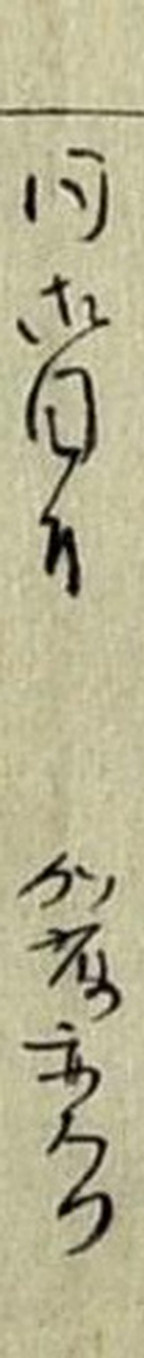同御目付加藤亦右衛門
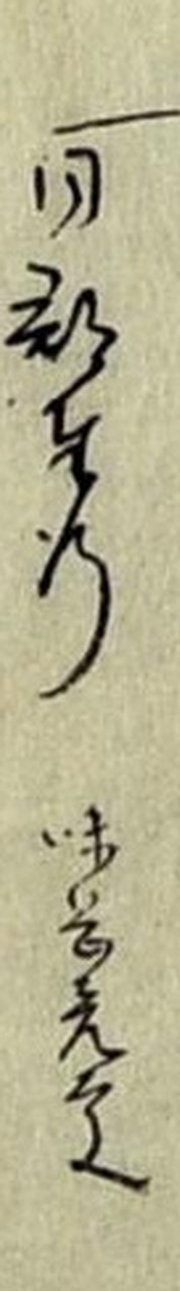同郡奉行味岡彦大夫
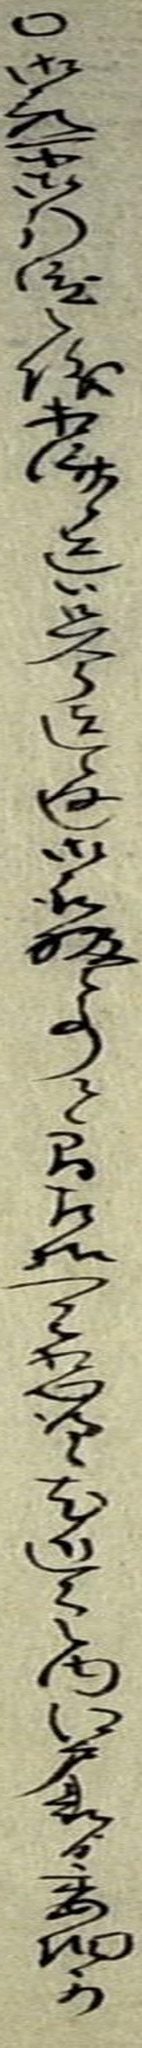〇御預所御引渡之儀相済候迄ハ只今迄之通御取扱候事ニ候間左様可被相心得候尤近々之内江戸表ゟ委細可
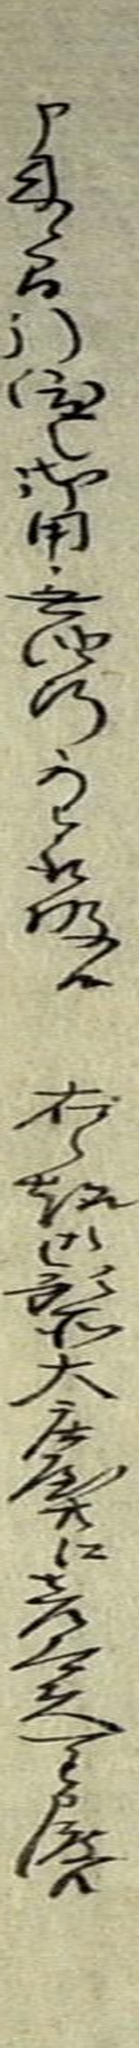申来候間引渡之御用無油断可被取扱候右之趣御預所大庄屋共江彦大夫可被申渡候
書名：命令之部 一
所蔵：福井県文書館 Fukui Prefectural Archives
